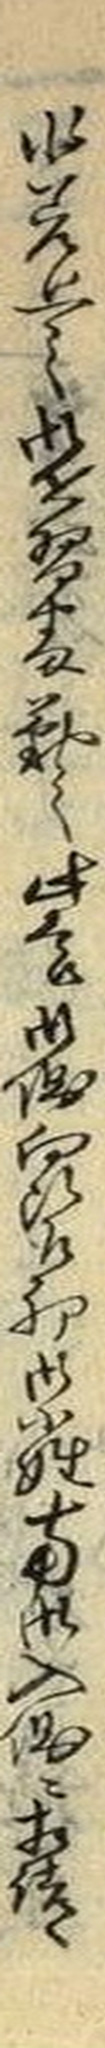水差上之御近習番勤之此節御側向頭取初御小姓南御入側ニ相詰候
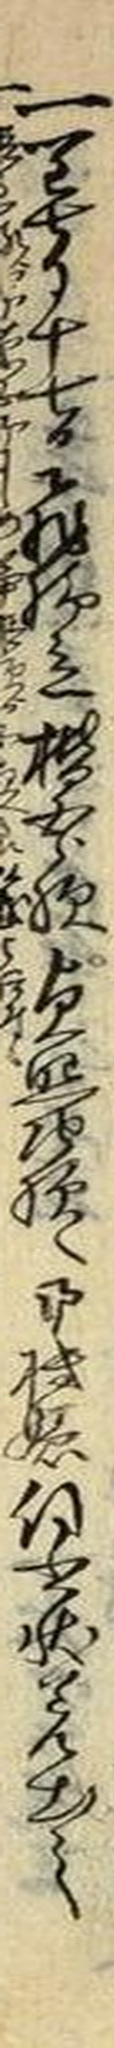一閏七月十七日飛脚立楷五郎様貞照院様へ御機嫌伺書状差出之
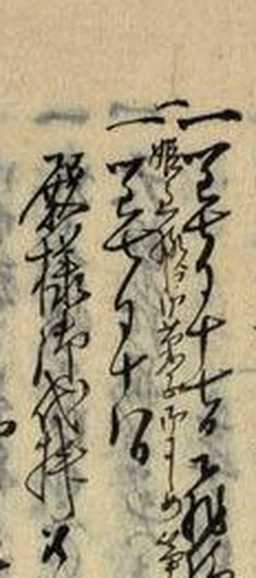一閏七月十六日
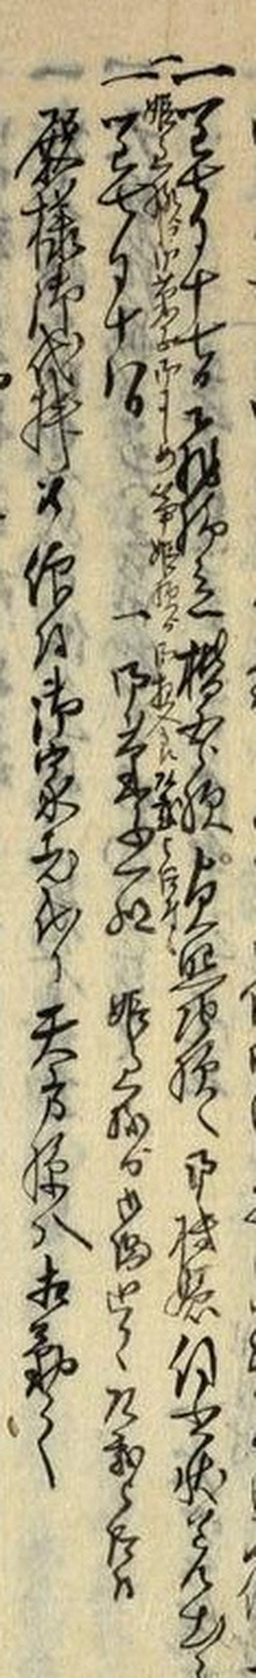一閏七月十八日一御菓子一組姫君様ゟ御側廻りへ頂戴被仰付
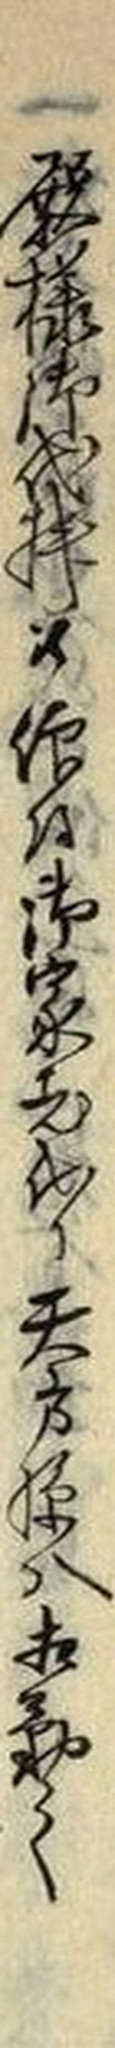殿様御代拝被仰付御家老代り天方孫八相勤之
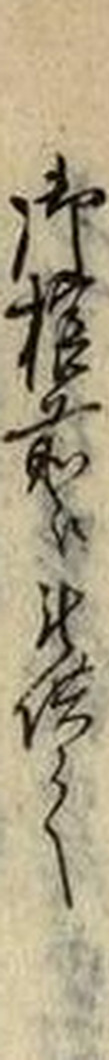御棺前江被供之
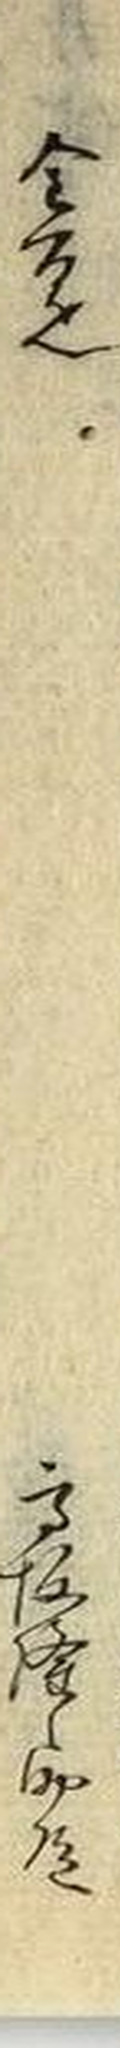金百疋高坂隆之助殿
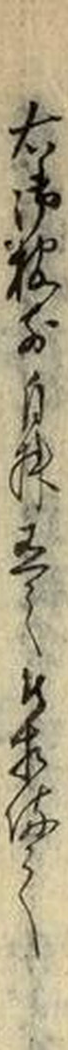右御棺前自拝有之被相備之

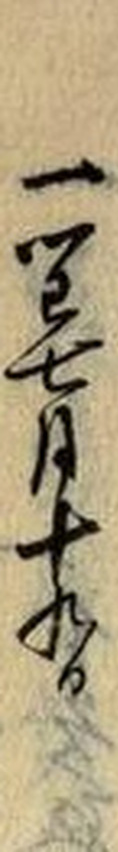一閏七月十九日
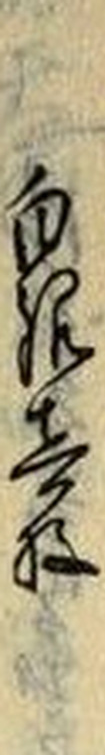白銀壱枚
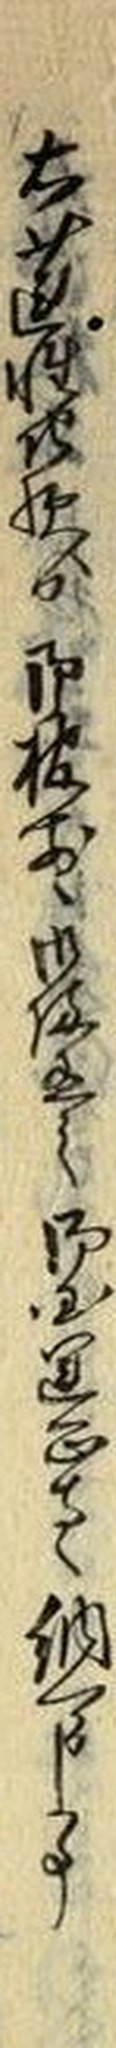右蓮性院様ゟ御棺前へ御備有之御国運正寺へ納可申事
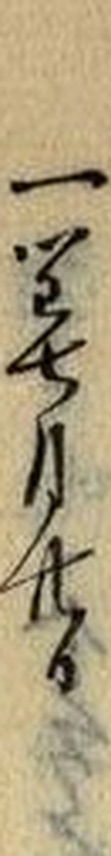一閏七月廿日
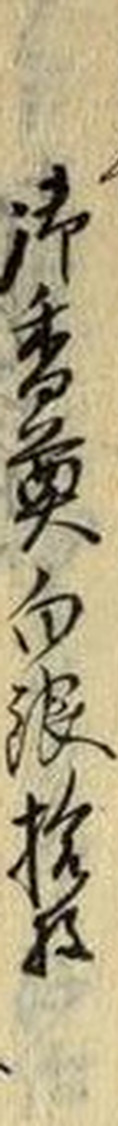御香奠白銀拾枚
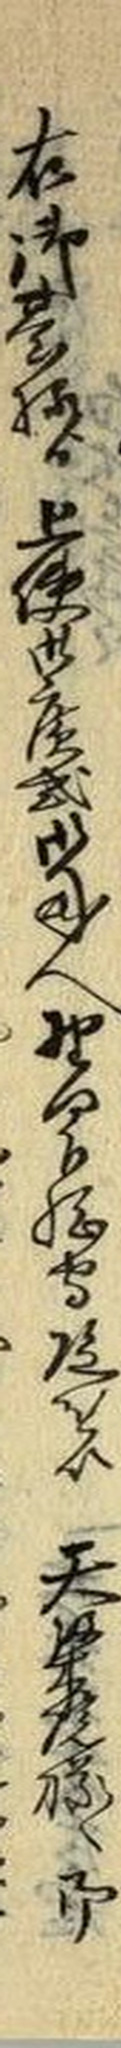右御台様ゟ上使御広式御用人野間下総守殿を以天梁院様へ御
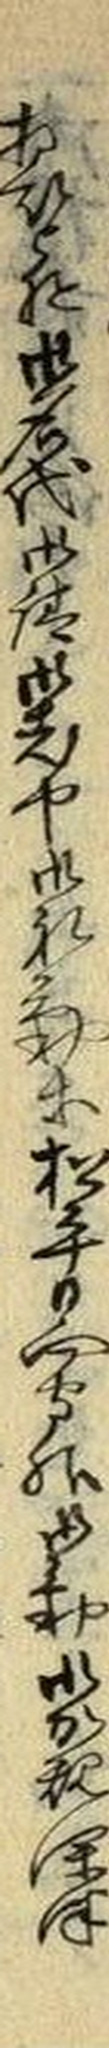拝領被遊御名代御請御老中御礼勤等松平日向守様御勤御加規深津
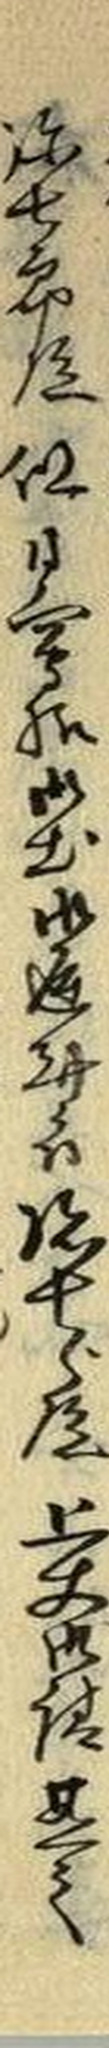弥七郎殿但日向守様御出御遅刻ニ付弥七郎殿上使御請有之
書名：少傅日録抄（斉承付側向頭取日記、在府）
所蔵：福井県文書館 Fukui Prefectural Archives
